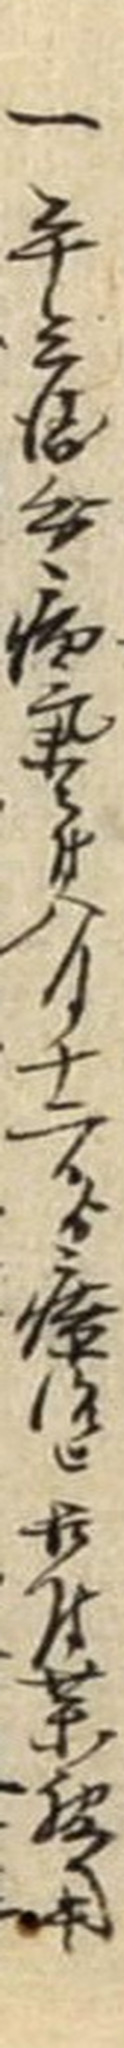一平兵衛義病気に付八月十二日ゟ療治被仰付薬服用
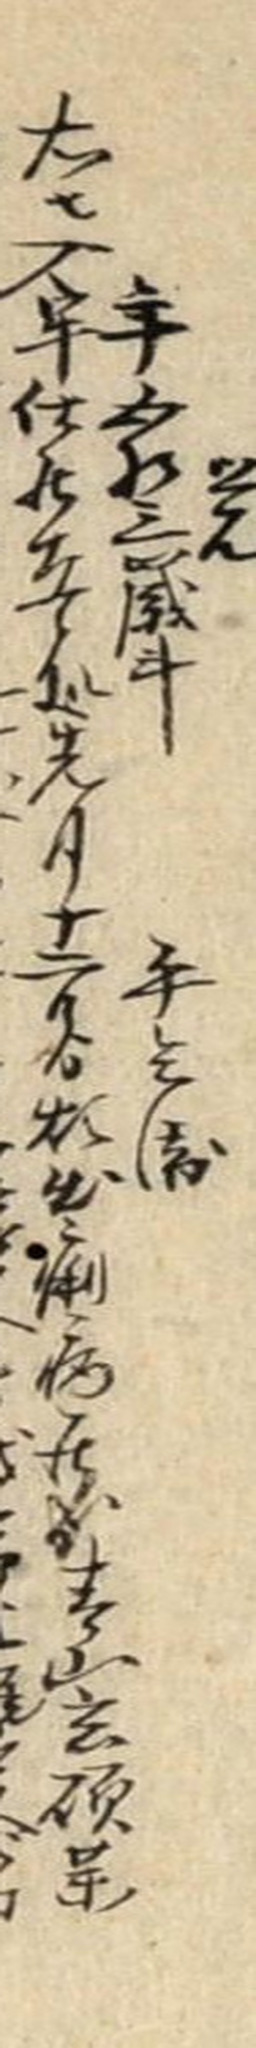右は入牢仕罷在候処先月十二日ゟ煩出痢病罷成春山玄碩薬
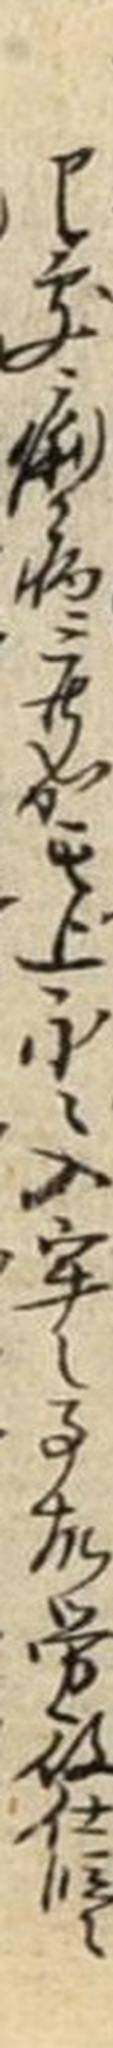申候処痢病に罷成其上永々入牢之事故労役仕段々
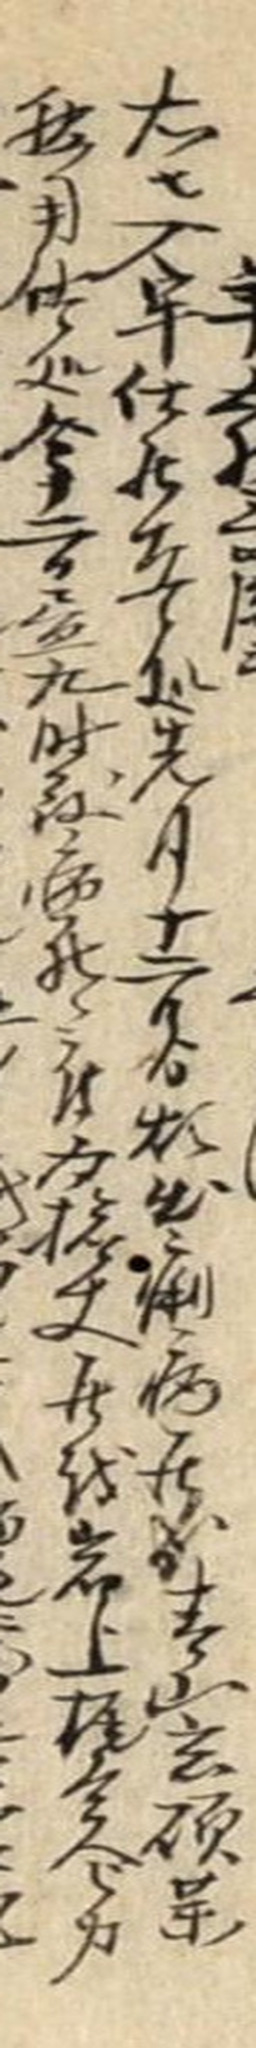服用仕候処今月二日夜九時致病死候に付為検使罷越岩上梶大夫与力
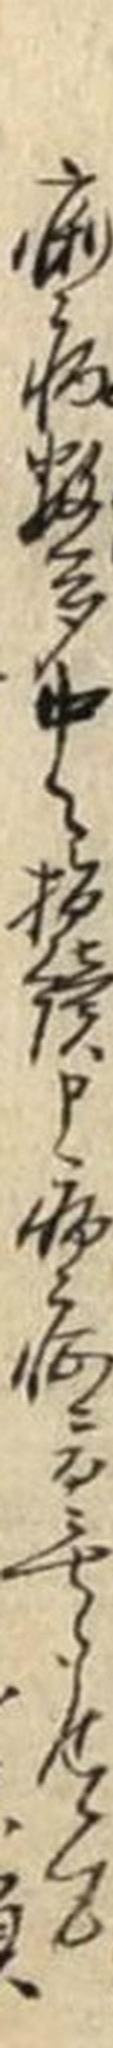痢病数多中々指続申病症にて無御座候以上
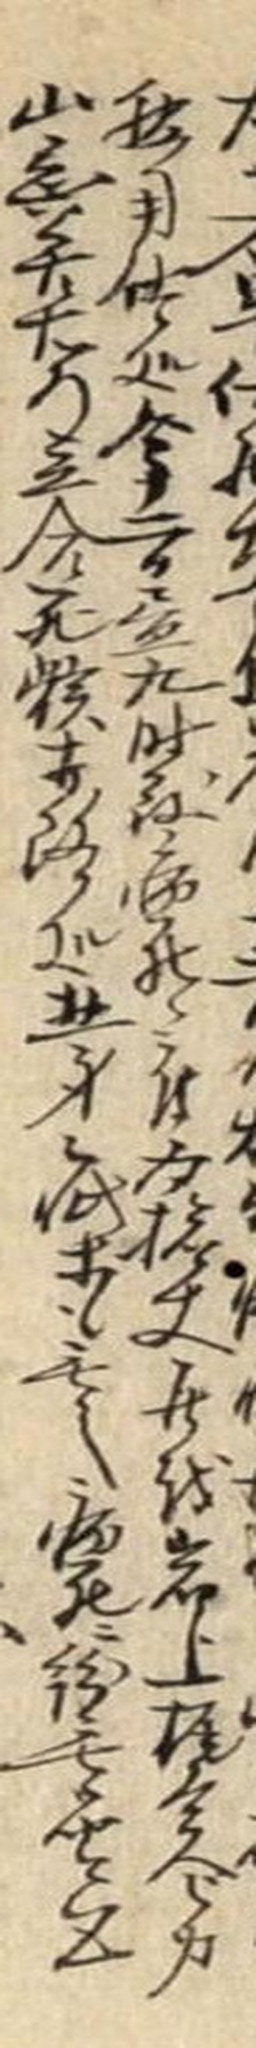山岡善右衛門立合死骸相改候処惣身疵等も無之病死に紛無御座候以上
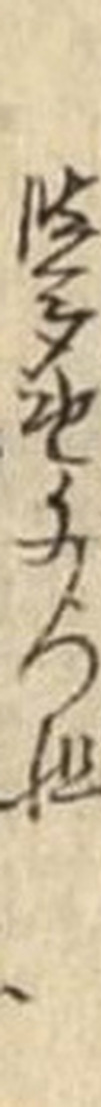波多野文右衛門組
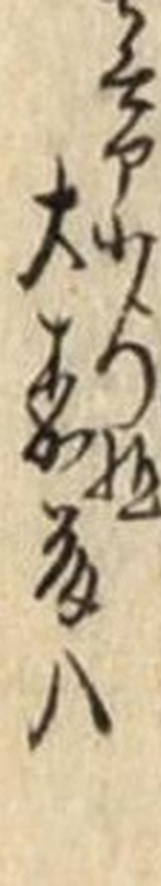大森藤八

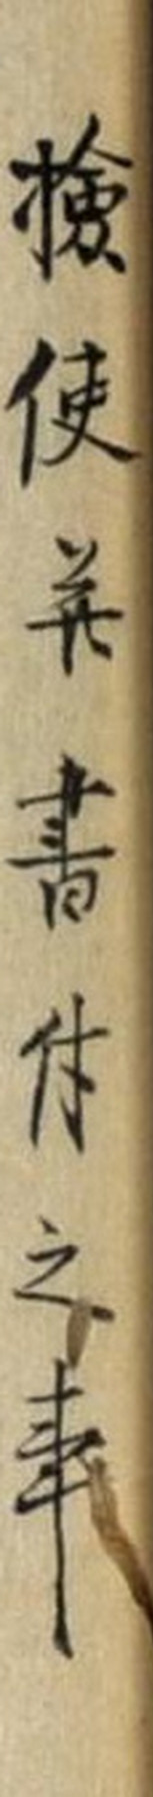検使并書付之事
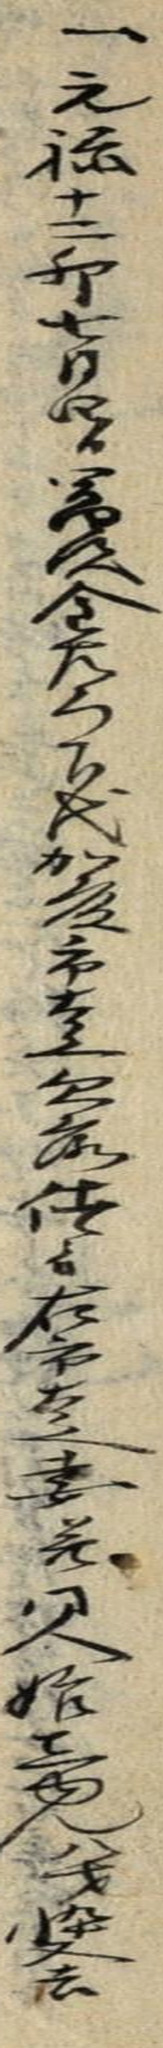一元禄十二卯七月四日富沢金左衛門下代加藤市大夫欠落仕候に付右市大夫妻并同人娘しゆん八才忰又吉
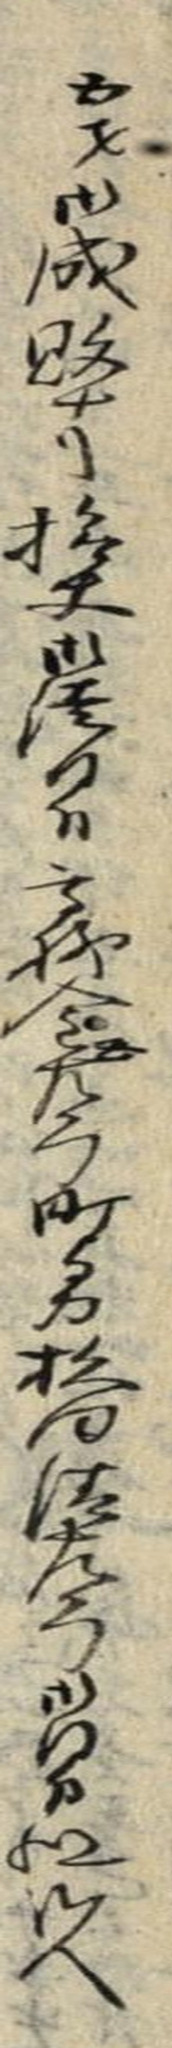五才御成敗ナリ検使御徒目付高柳金五左衛門町与力杉田清左衛門御目付組弐人
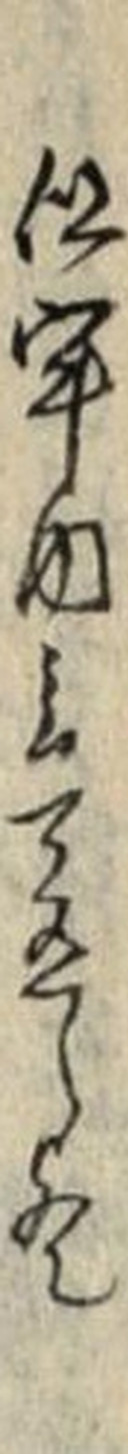但牢内にて可有之歟
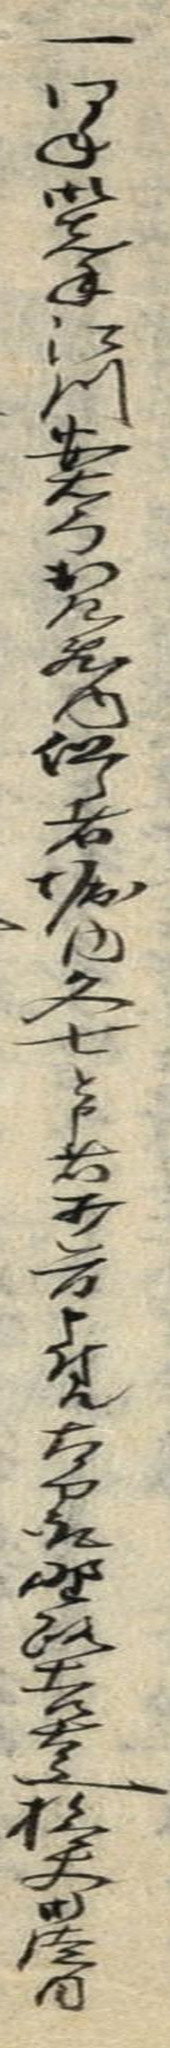一同年御先手江川安右衛門於屋敷内組之者堀内久七と申者打首申付ル太刀取野路吉大夫検使御徒目
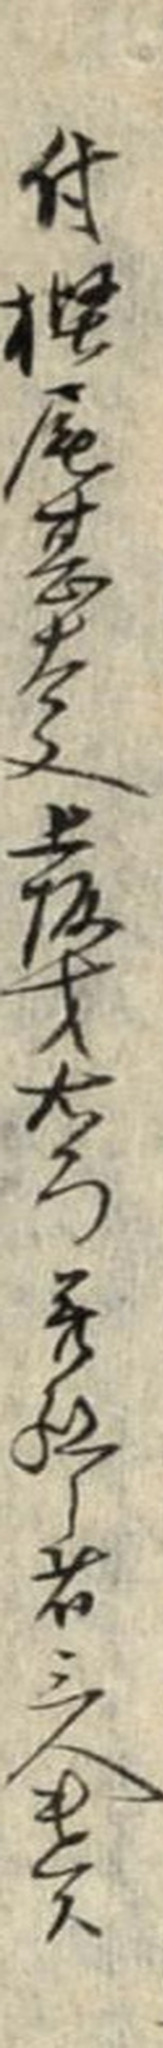付樫尾甚大夫上坂才右衛門并組之者三人遣ス
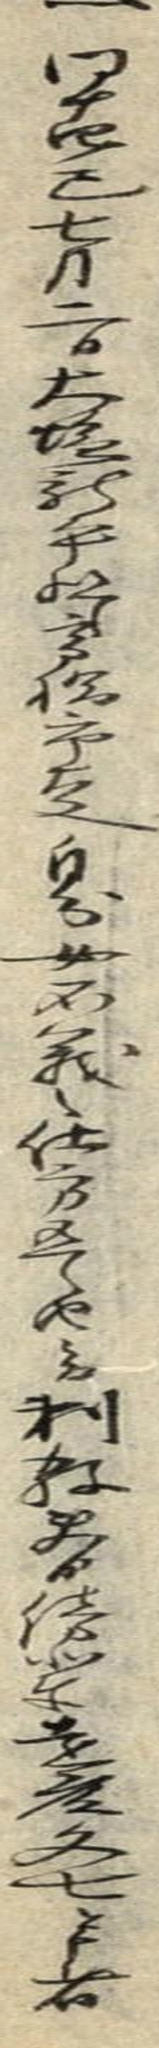一同十四巳七月二日大塩新平組之高橋市大夫自分女不義之仕方有之由にて刺殺夫ゟ傍輩遠藤久七と申者
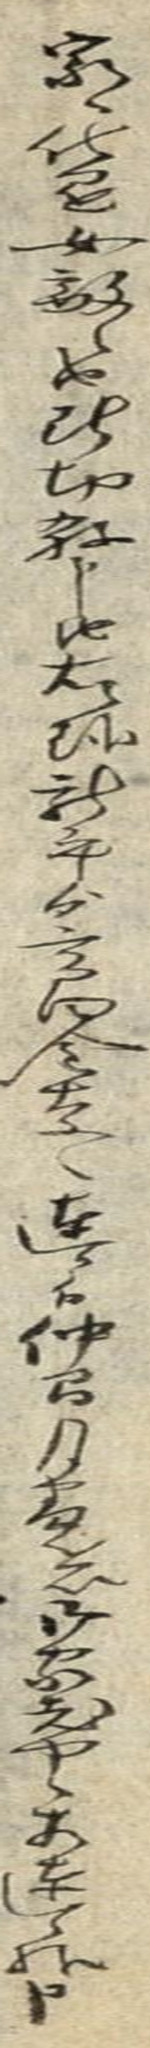家へ仕懸女敵之由断切殺申由右之趣新平ゟ高田金大夫へ達候に付仲間月番を以御家老中へ相達候様申
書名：御停止異変死失
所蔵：福井県文書館 Fukui Prefectural Archives
